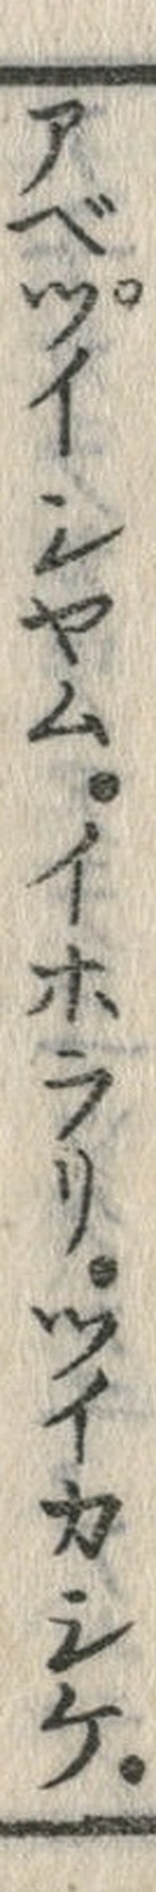アベツ゚イシヤム。イホラリ。ツイカシケ。
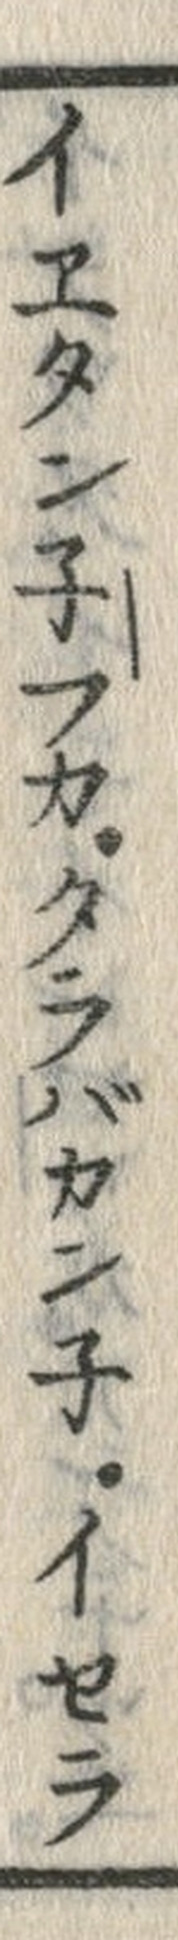イヱタンネフカ。タラバカンネ。イセラ
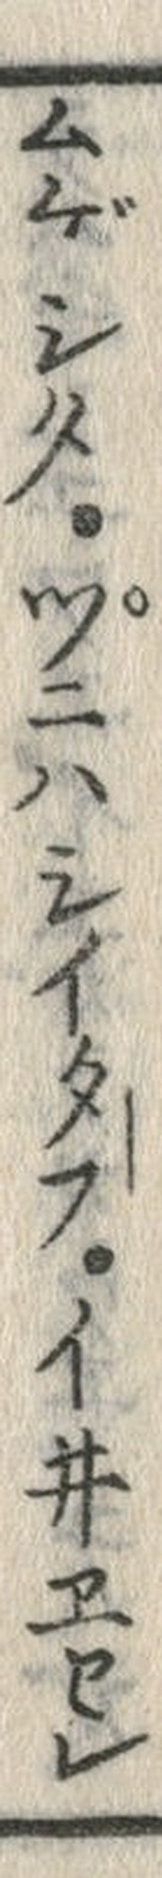ムゲシタ。ツ゚ニハシイタフ。イヰヱセレ
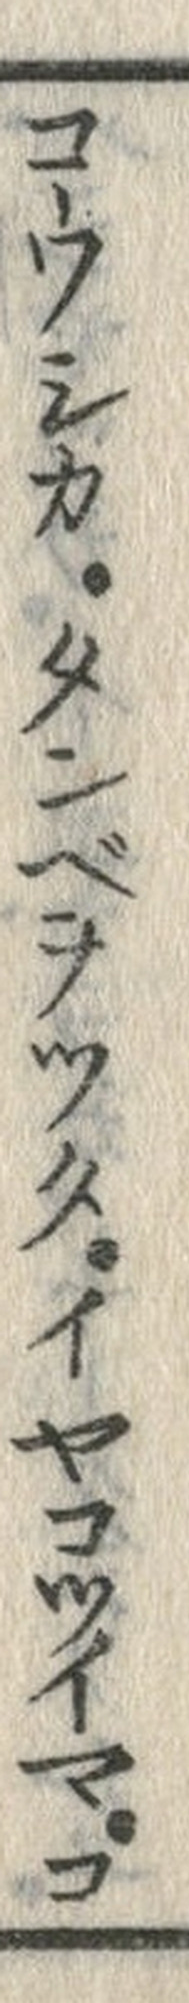コウシカ。タンベヲツタ。イヤコツイマ。コ
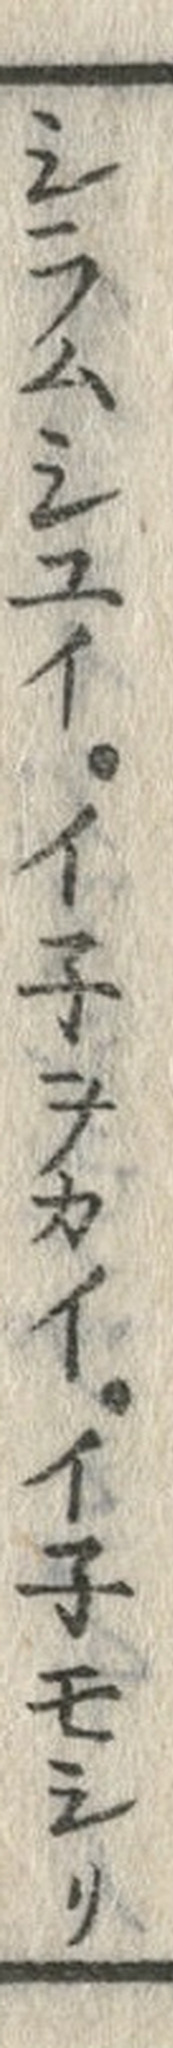シラムシユイ。イネヲカイ。イネモシリ

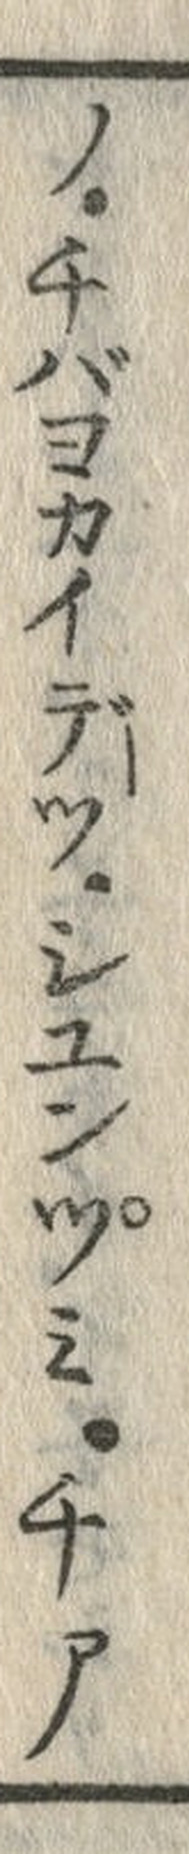ノ。チバヨカイデツ。シユンツ゚ミ。チア
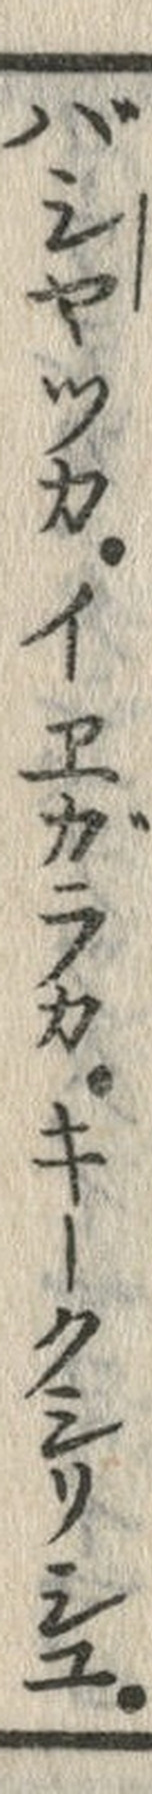バシヤツカ。イヱガラカ。キークシリシユ。
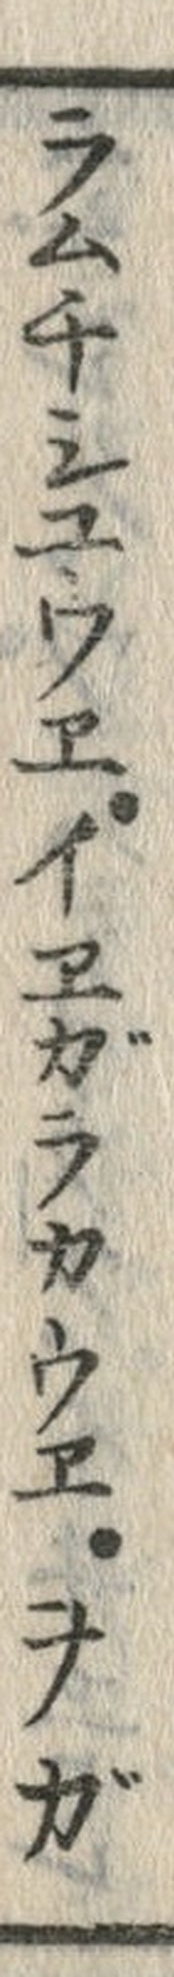ラムチシユウヱ。イヱガラカヱ。ヲガ
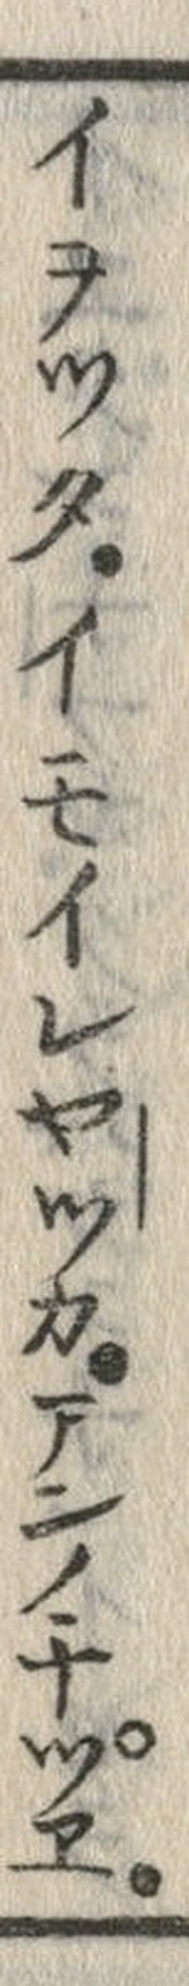イヲツタ。イモイレヤツカ。アンノチツ゚ヱ。
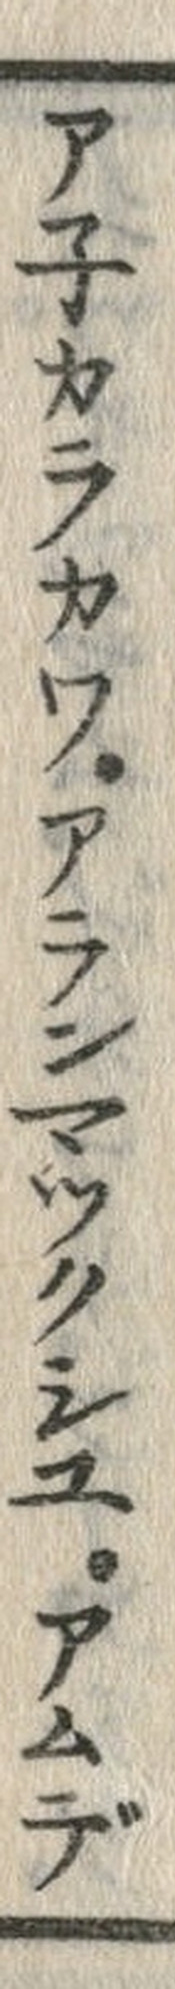アネカラカワ。アランマツクシユ。アムデ
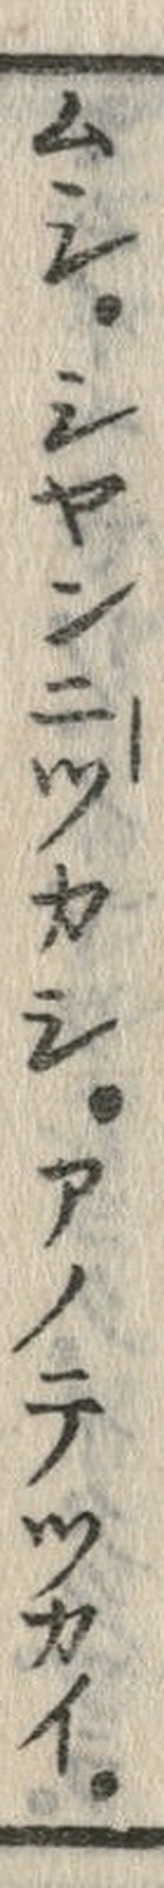ムシ。シヤンニツカシ。アノテツカイ。
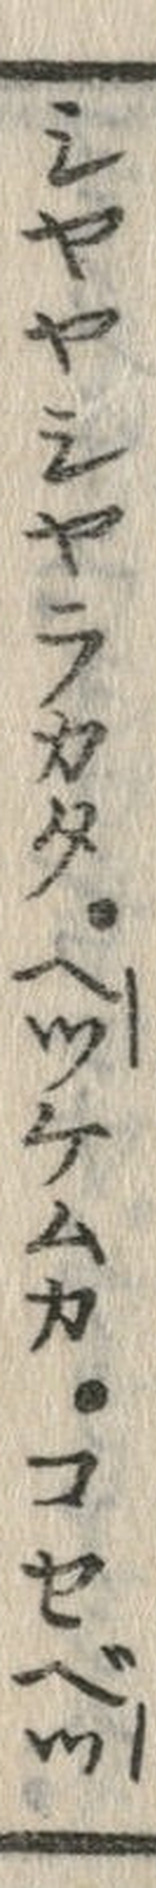シヤヤシヤラカタ。ヘツケムカ。コセベツ
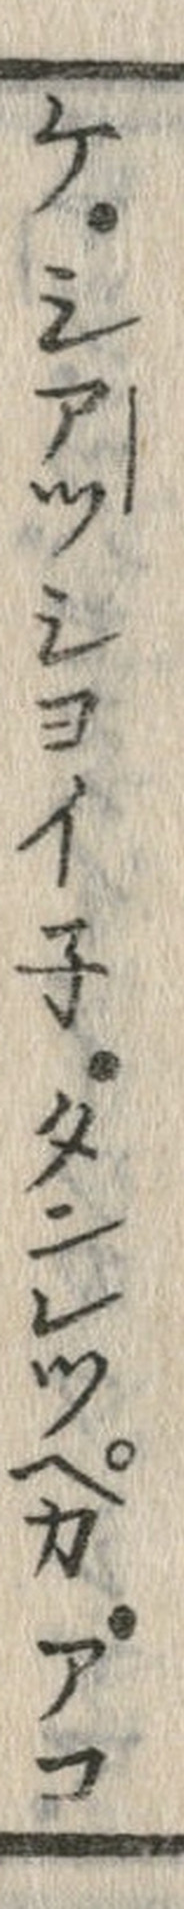ケ。シアツシヨイネ。タンレツペカ。アコ

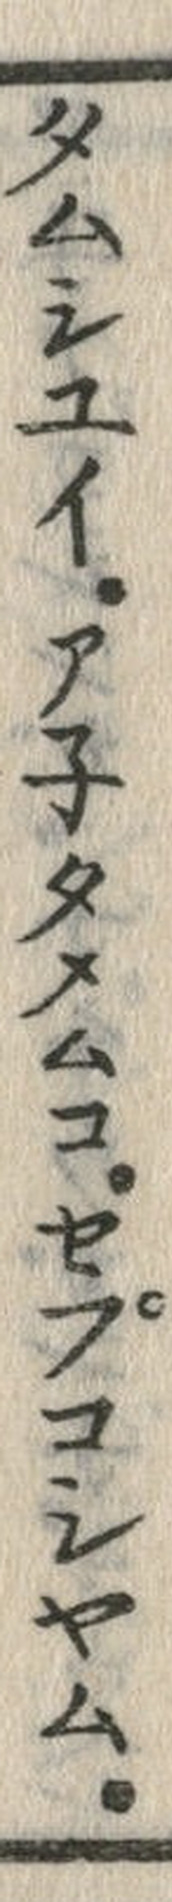タムシユイ。アネタメムコ。セプコシヤム。
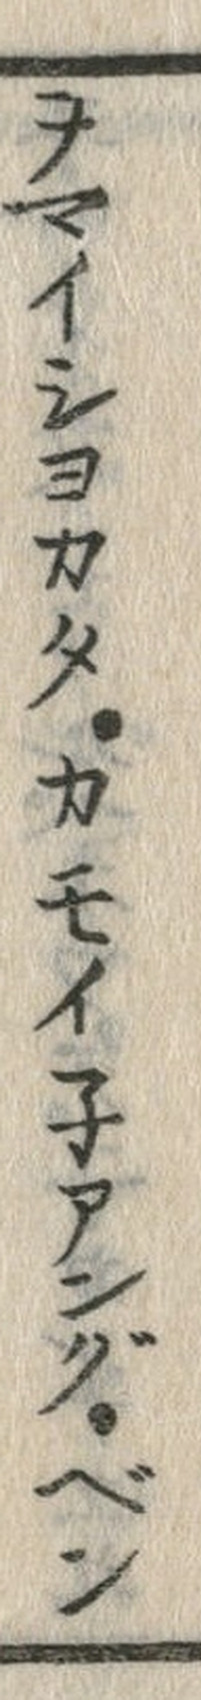ヲマイシヨカタ。カモイネアング。ベン
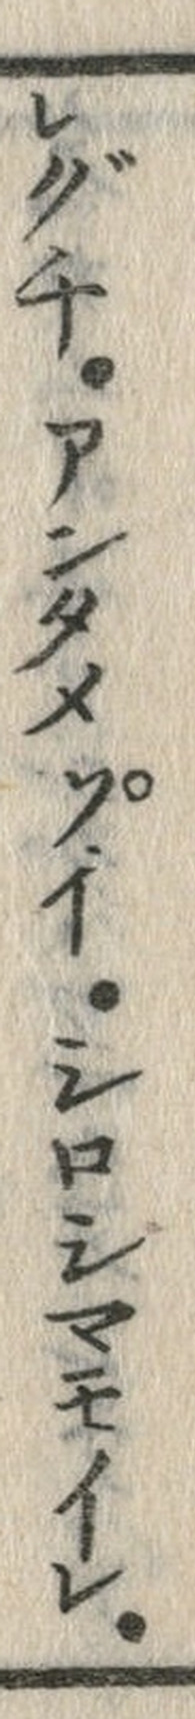レグチ。アンタメツ゚イ。シロシマモイレ。
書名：蝦夷方言藻汐草　坤巻
